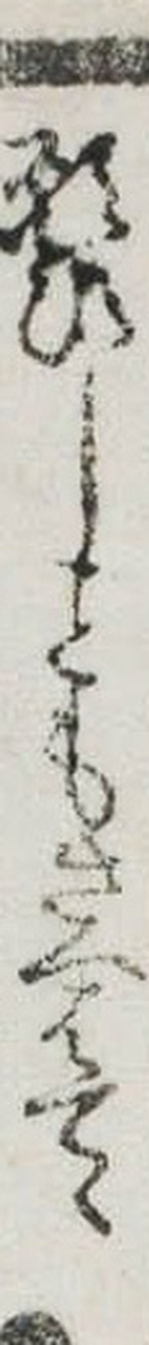願ひしこともきへはてゝ
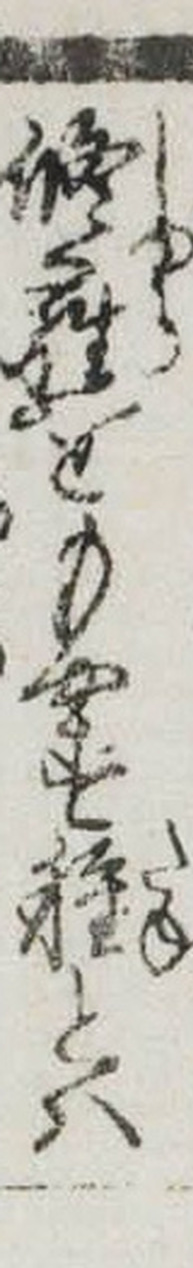修羅をもやす種とは
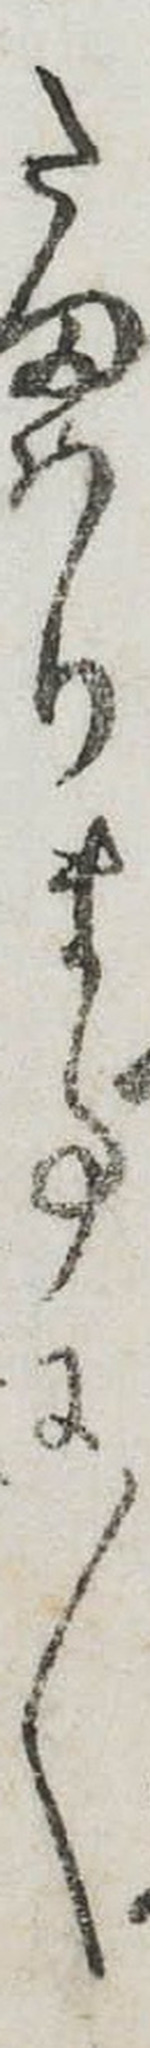たまはりま事に〳〵
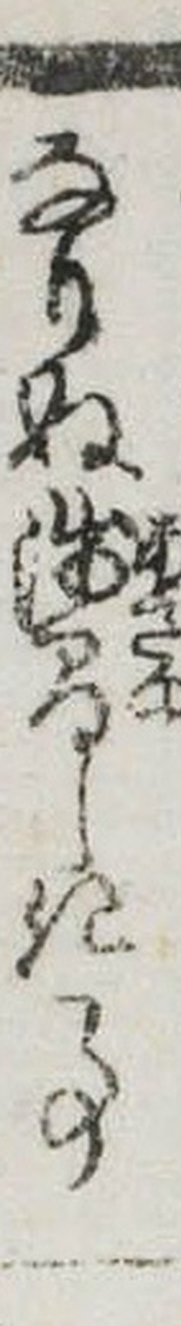なりぬ浅間しき事
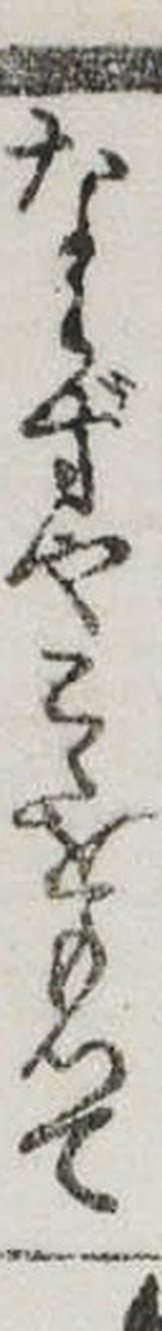ならずやこゝをもつて
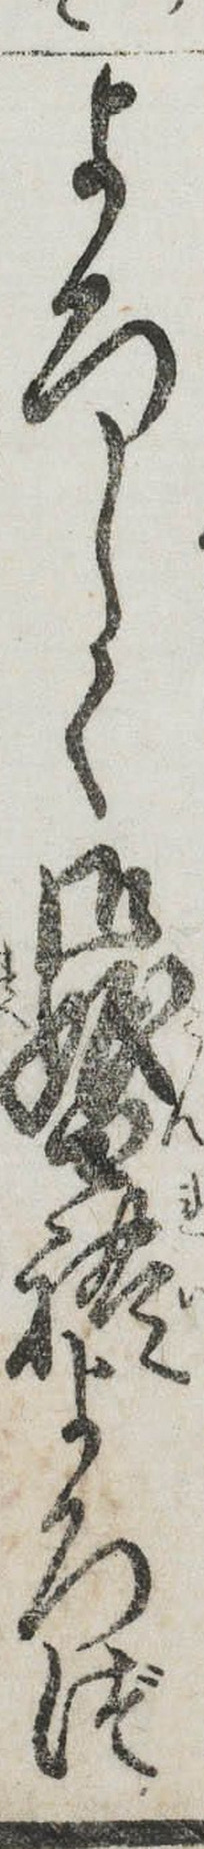よろしく御婚礼よろづ
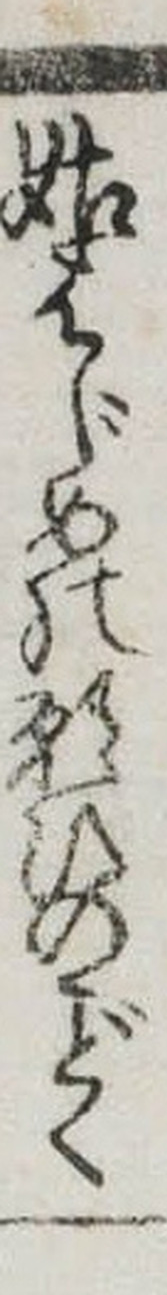姑はじめの願ひのごとく
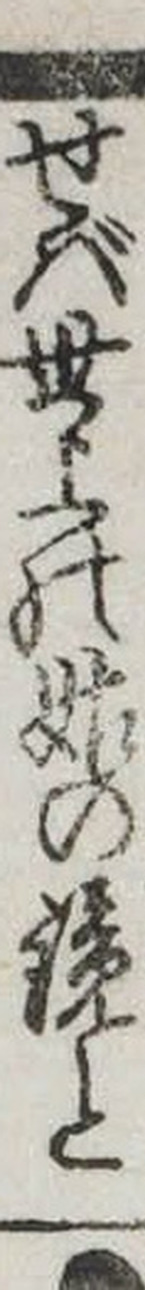せば世上の姑の鏡と
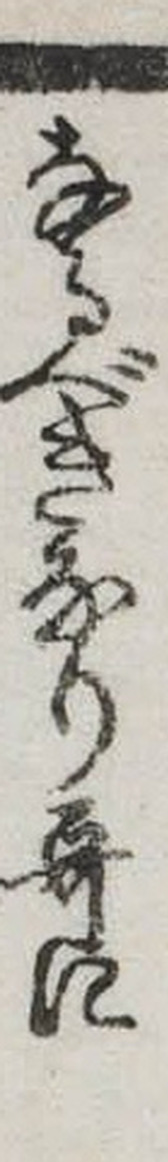なるべきなり歌に
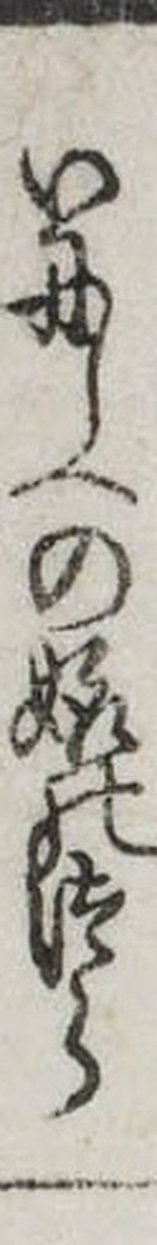いにしへの娵のつら
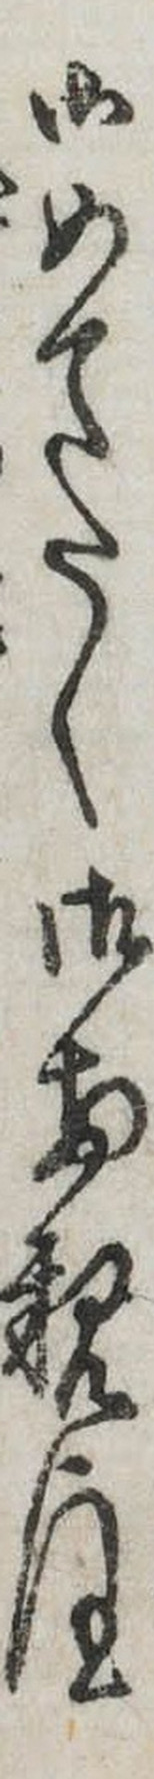御めてたく御両親さま
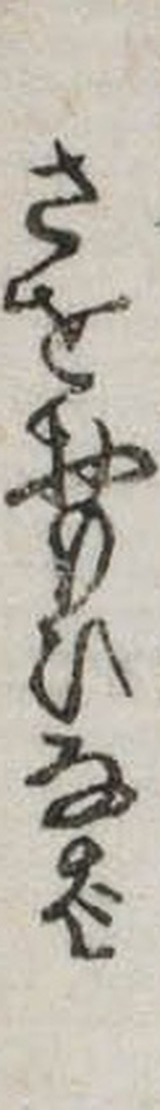さをおもひなば
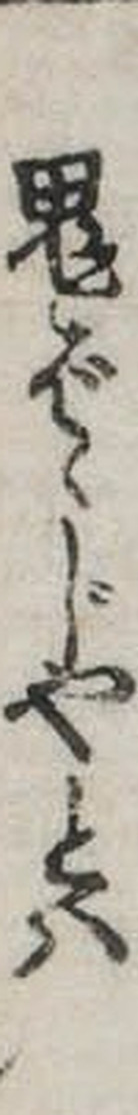鬼ばゝじやとは
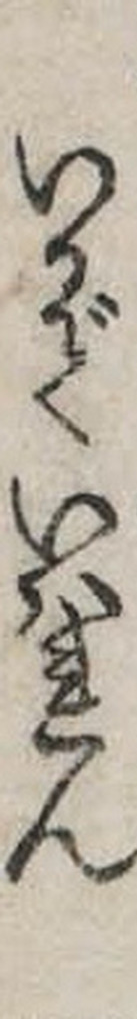いかでいはれん
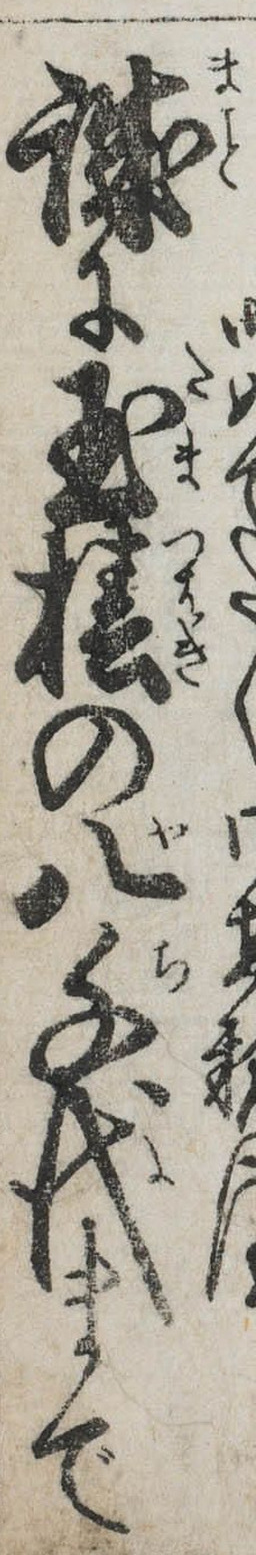誠に玉椿の八千代まで

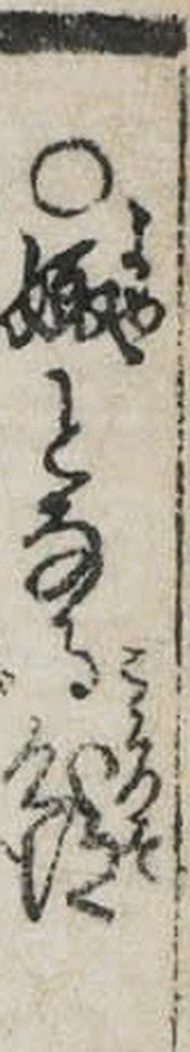○娵となる心得
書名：頭書萬用婦人手紙之文言
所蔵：東京学芸大学教育コンテンツアーカイブ
